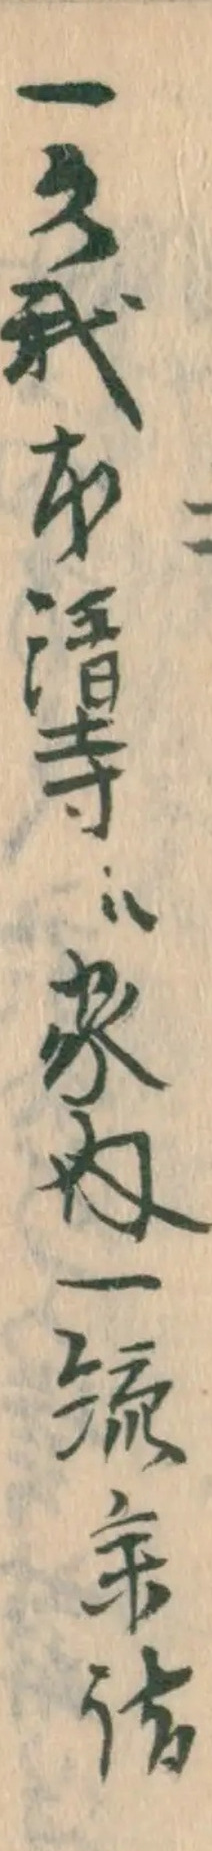一久我本清寺え家内一統参詣
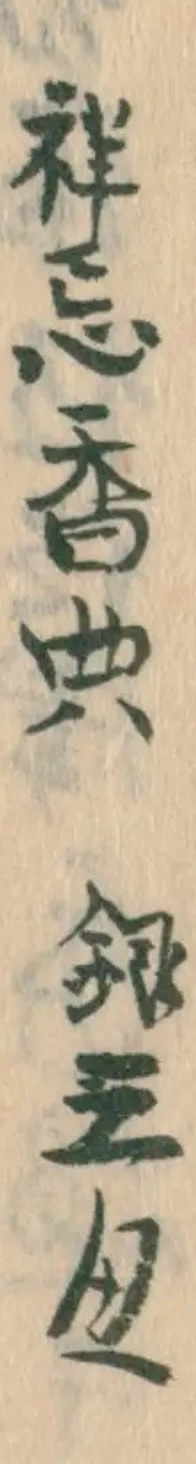祥忌香典銀三匁
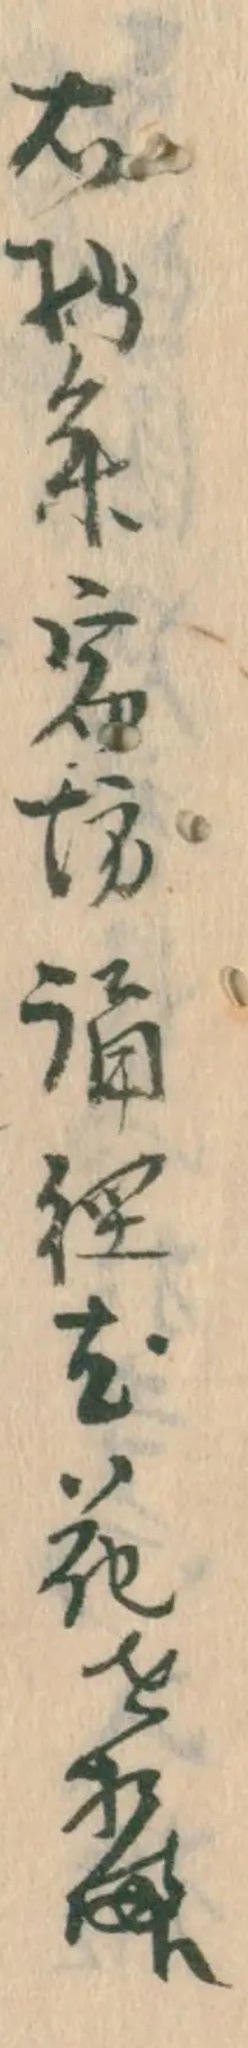右持参宿坊誦経尤花を相備ル
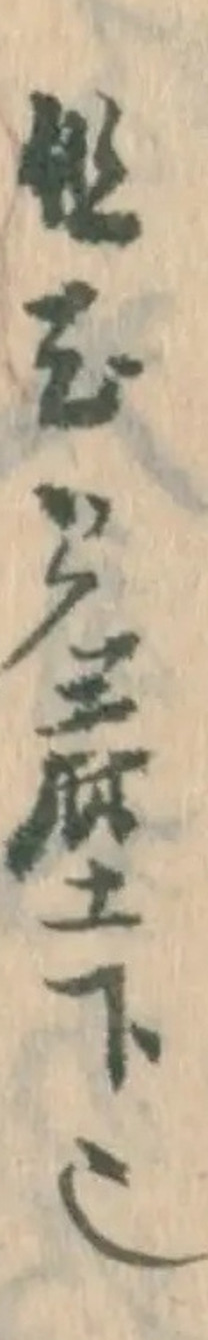但尤着麻上下也
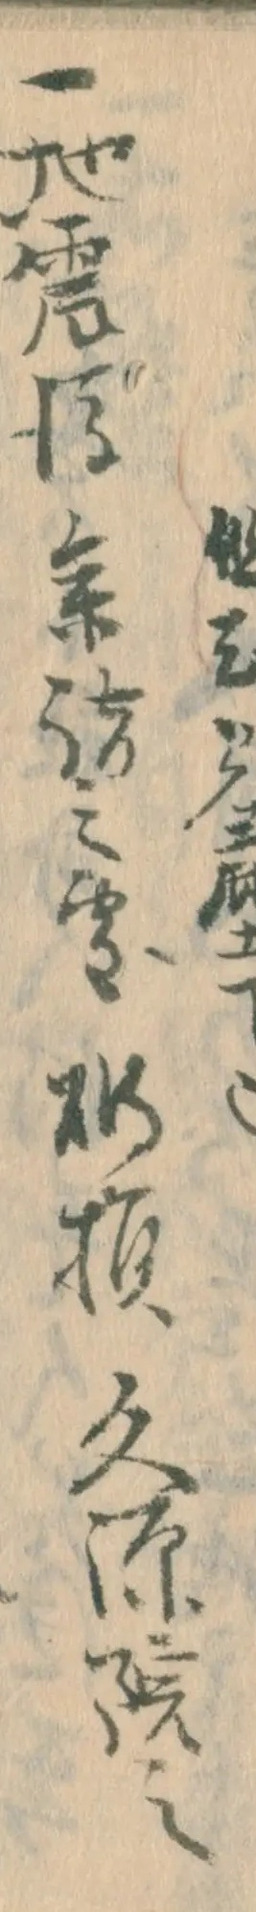一地震後参詣之処破損久源院之

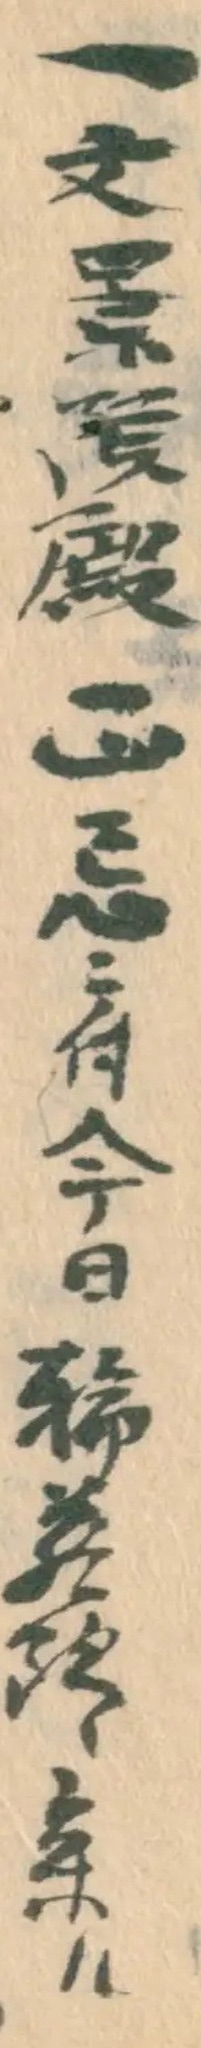一文景院殿正忌ニ付今日輪蔵院へ参ル
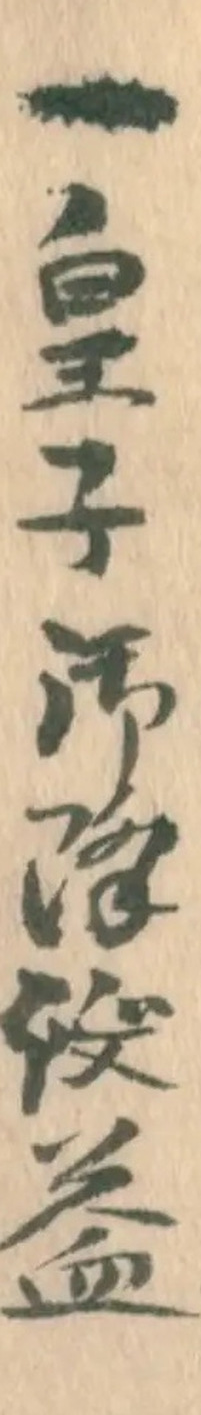一皇子御降誕益
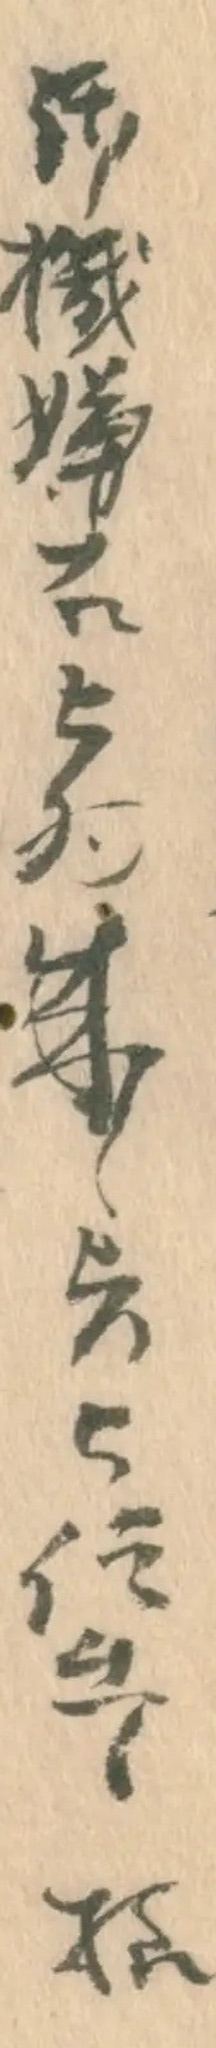御機嫌克被為成候旨被仰出候様
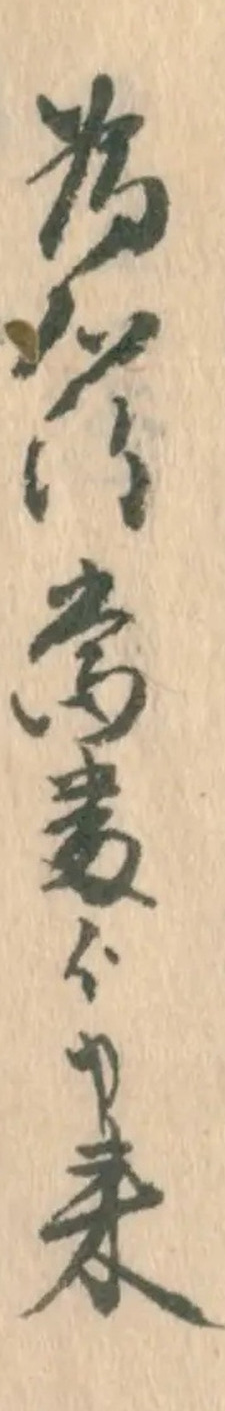為心得当番ゟ申来
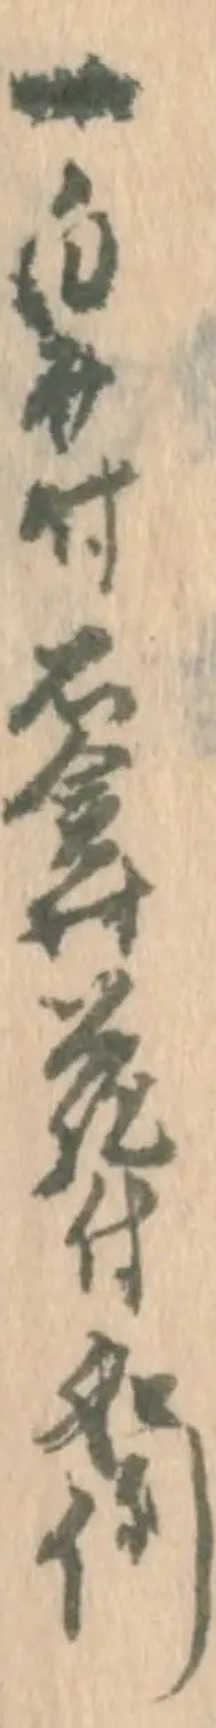一白井村石倉村蔵付如例
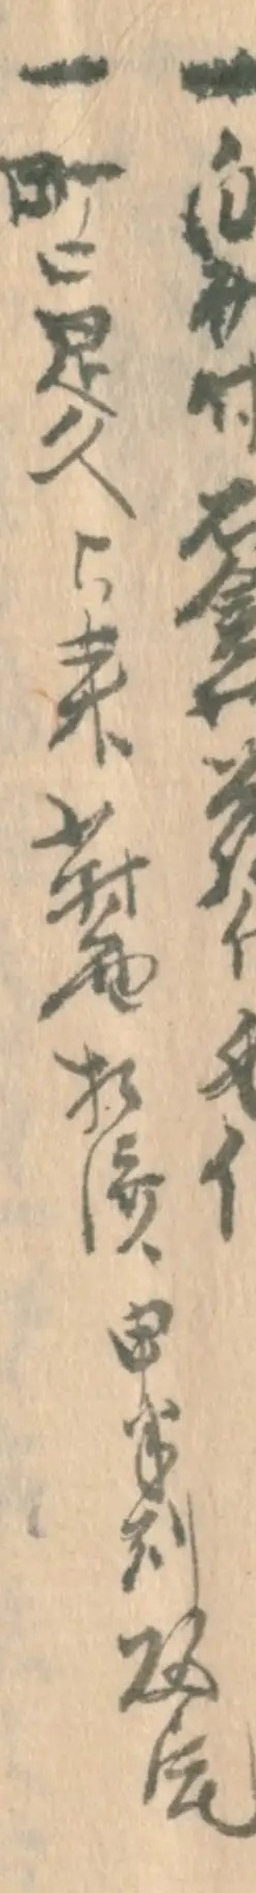一町口是久被参対面相済申半刻帰宅
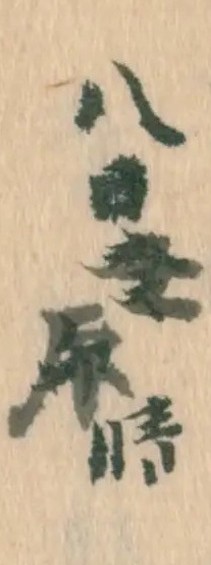八日壬辰晴
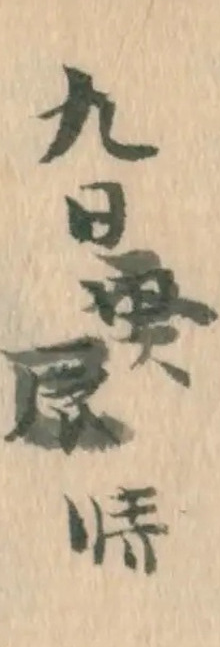九日癸巳晴
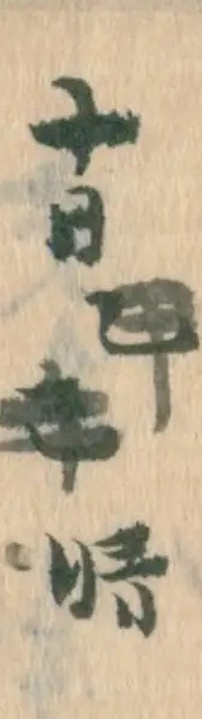十日甲午晴
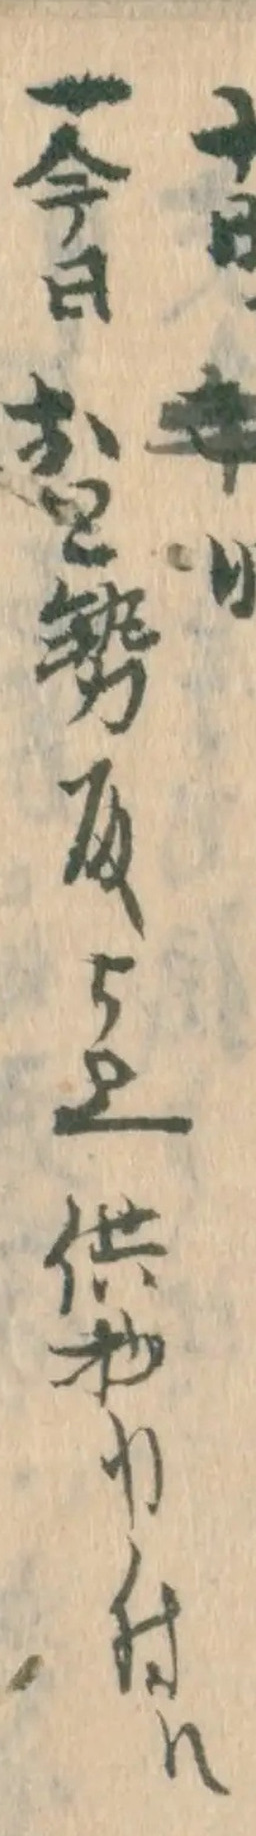一今日おと勢殿被上供物申付ル

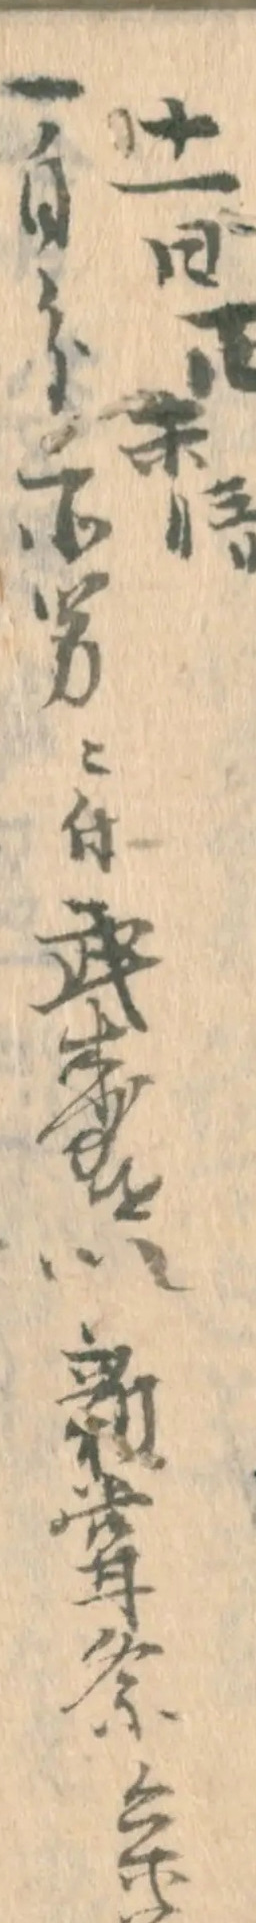一自分所労ニ付武寿を以新嘗祭参勤
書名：禁裏御所御用日記. [131]
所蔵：国立国会図書館 National Diet Library, JAPAN
